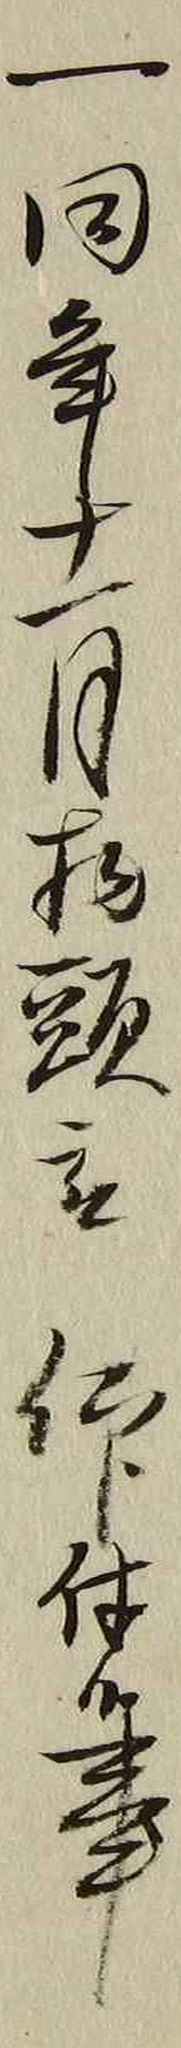一同年十一月物頭被仰付候事
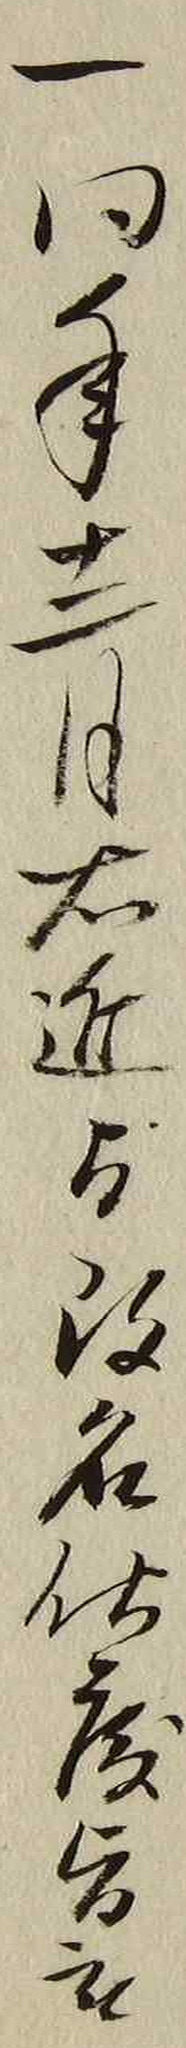一同年十二月右近与改名仕度旨被
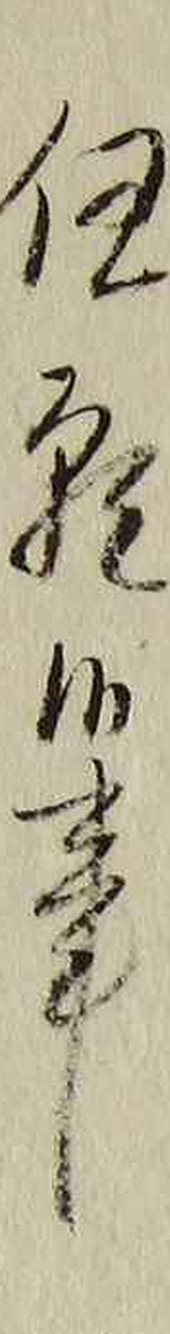任願候事
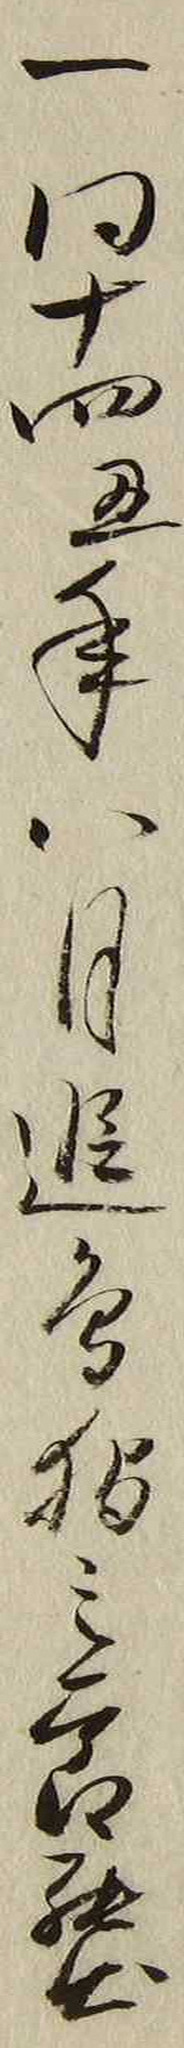一同十四丑年八月追鳥狩之節罷出
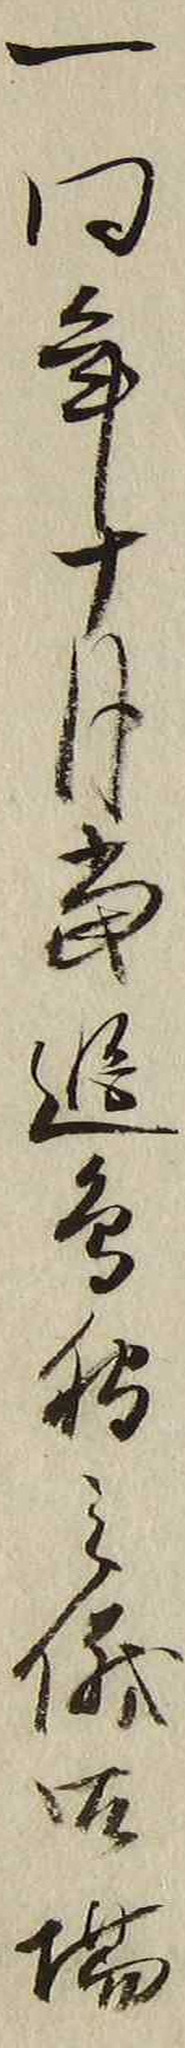一同年十月当追鳥狩之儀御場

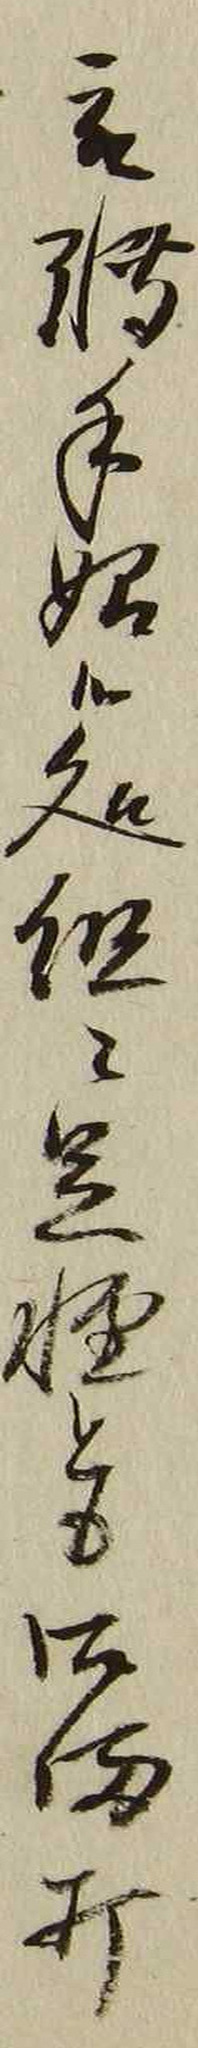被転手始候処組々足軽とも御備打
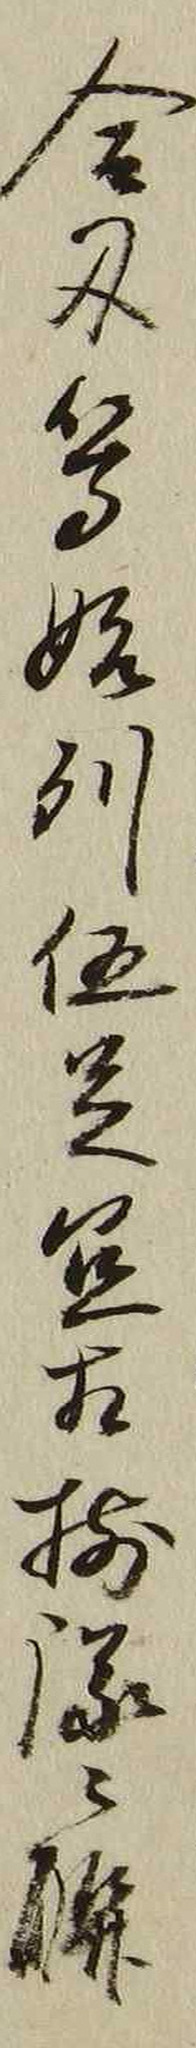合刃等始列伍足宜相揃隊々聯
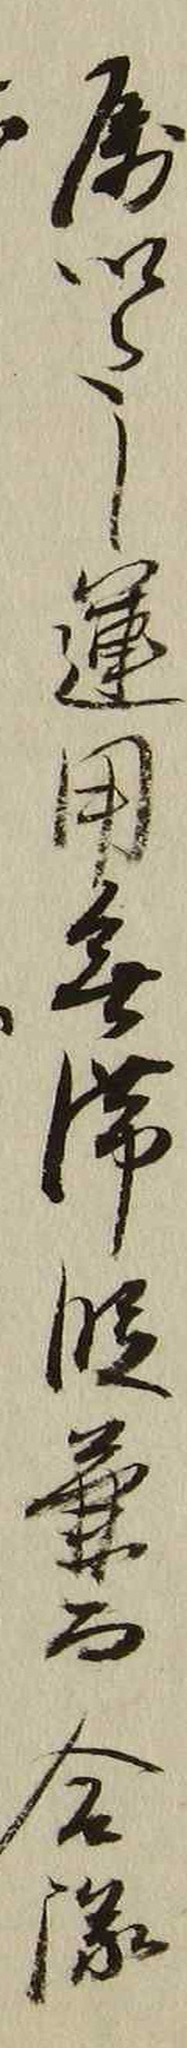属いたし運用無滞段兼而合隊
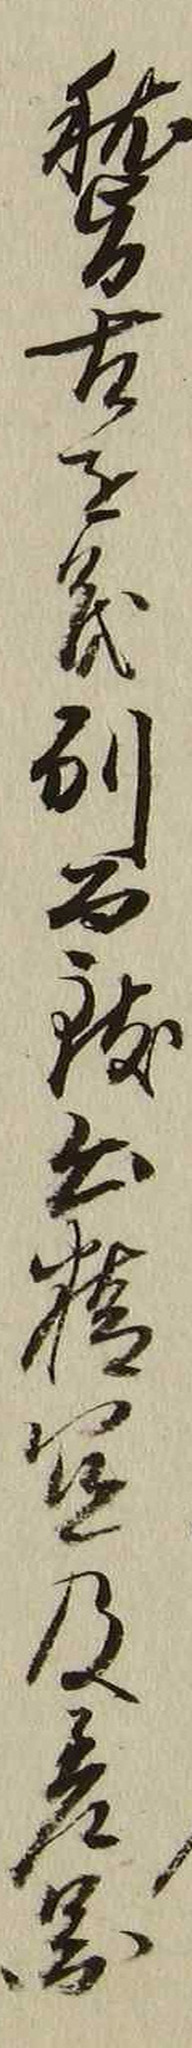稽古を茂別而致出精宜及差図
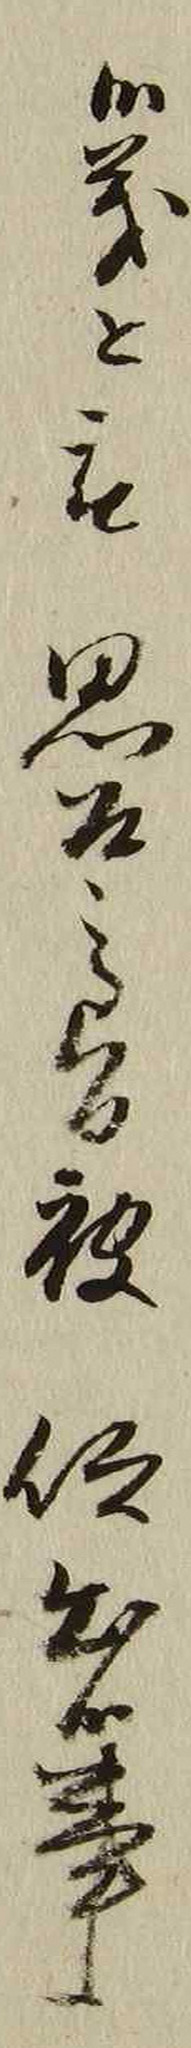候義と被思召之旨被仰出候事
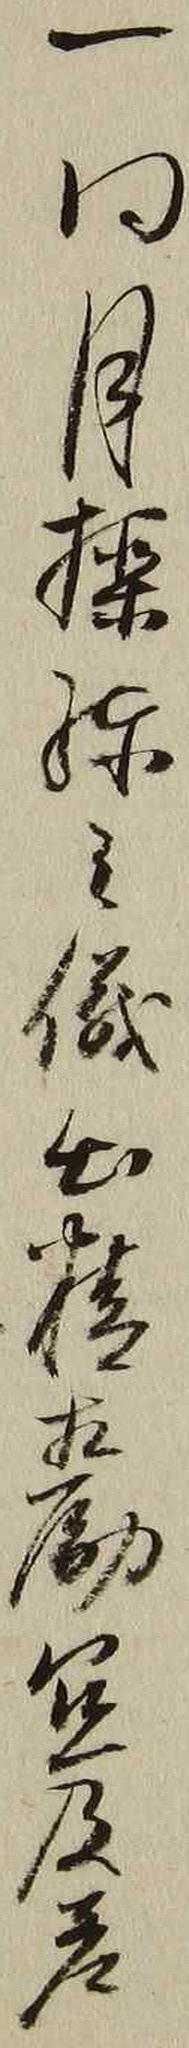一同月操練之儀出精相励宜及差
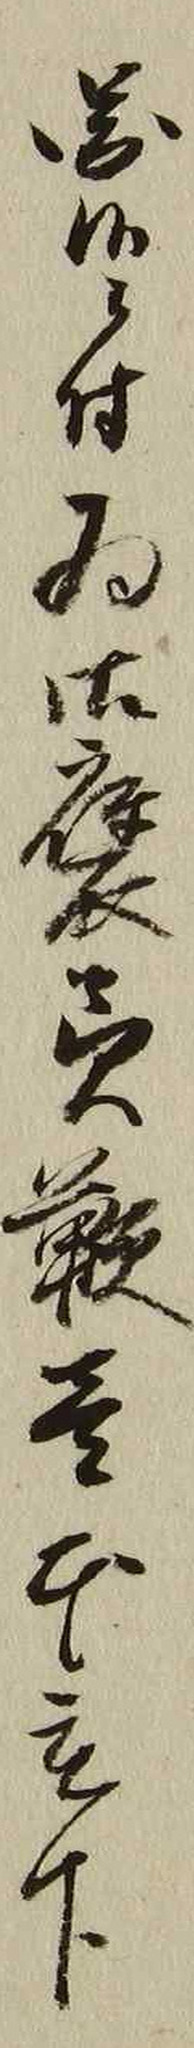図候ニ付為御褒美鞭壱本被下
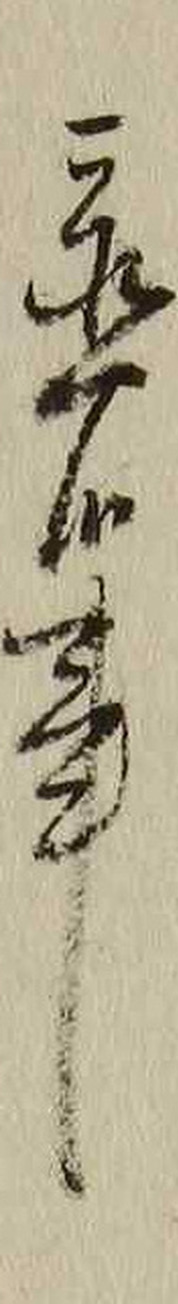置候事
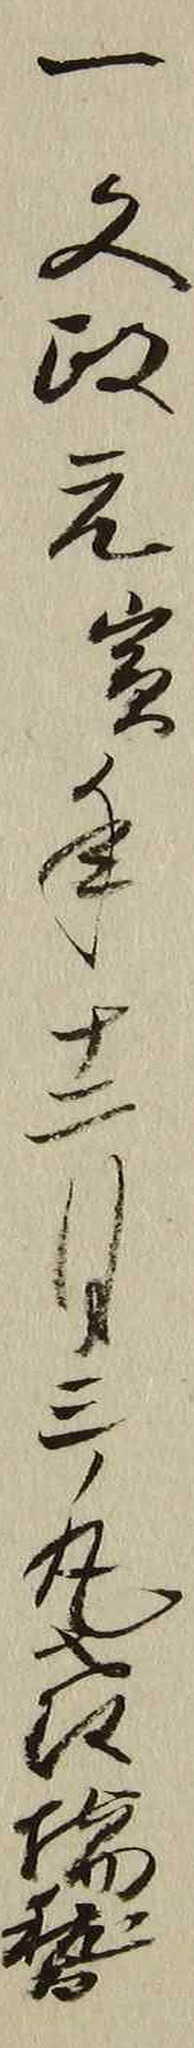一文政元寅年十二月三ノ丸教場稽
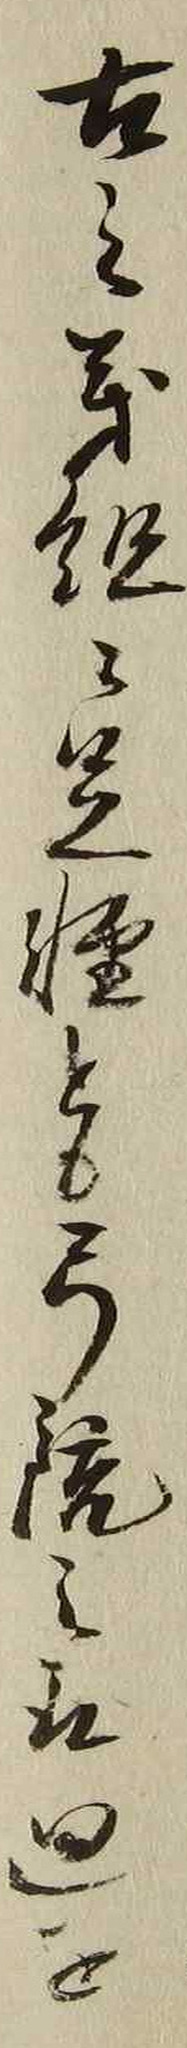古之義組々足軽とも弓銃之取廻を
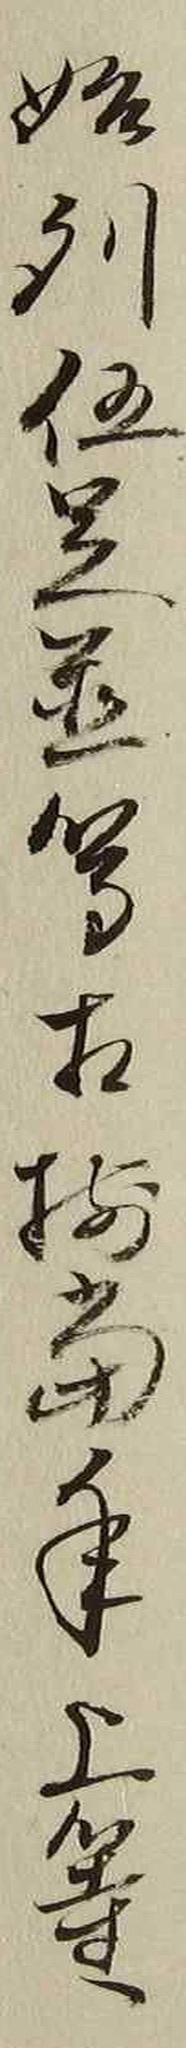始列伍足並等相揃当年上等へ
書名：諸士系譜　巻之351　す之部1
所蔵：会津若松市立会津図書館
